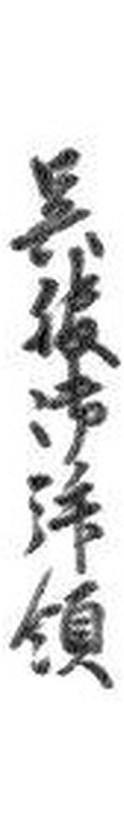呉服御拝領
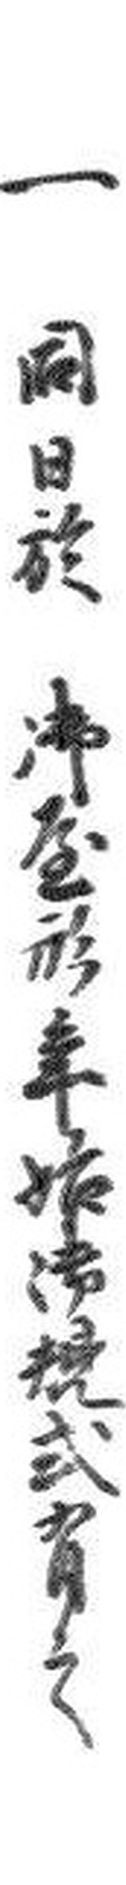一同日於御屋形年始御規式有之
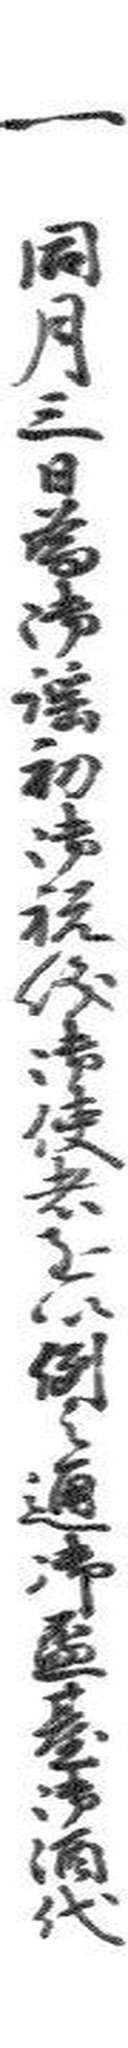一同月三日為御謡初御祝儀御使者を以例之通御盃台御酒代
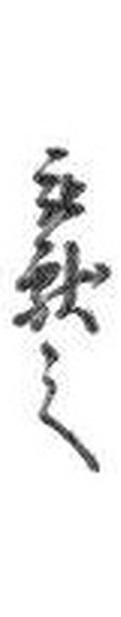被献之
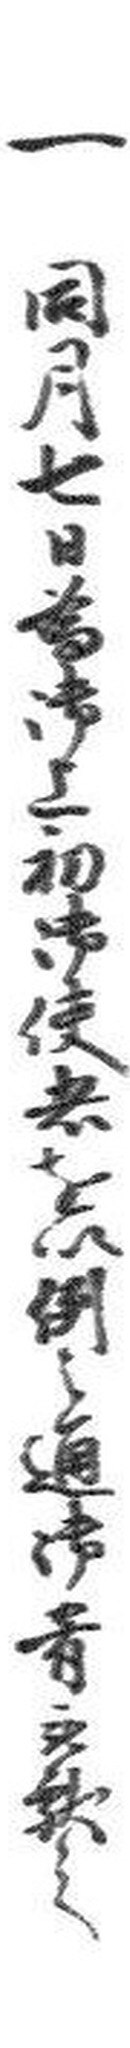一同月七日為御上初御使者を以例之通御肴被献之

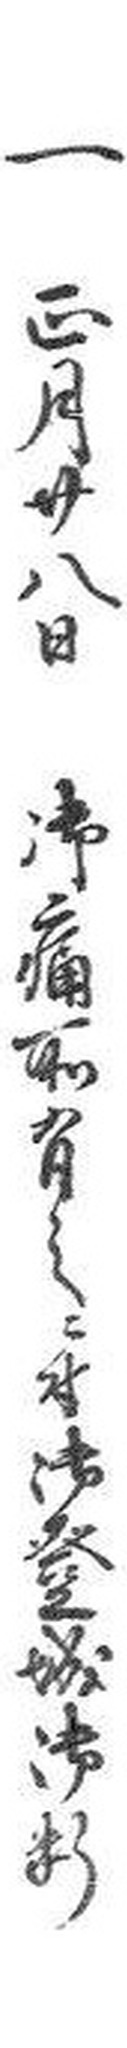一正月廿八日御痛所有之二付御登城御断
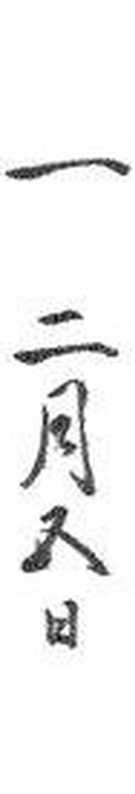一二月五日
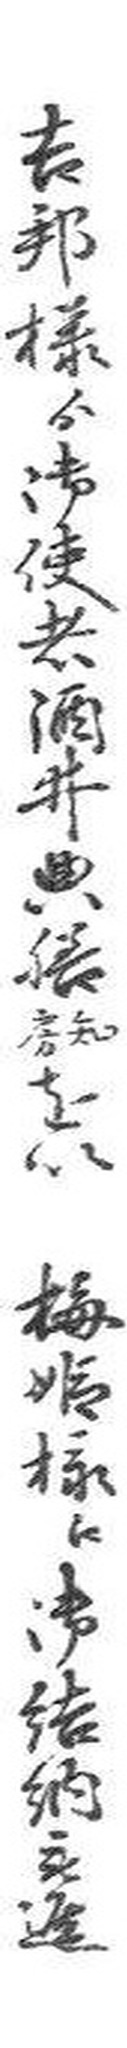吉邦様ゟ御使者酒井典膳知房を以梅姫様江御結納被進
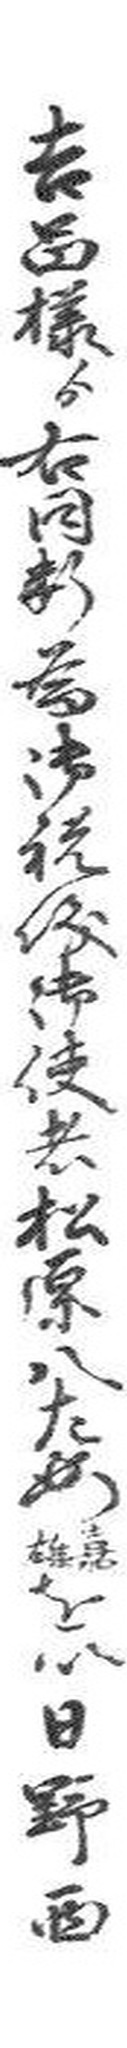吉品様ゟ右同断為御祝儀御使者松原八左衛門嘉雄を以日野西
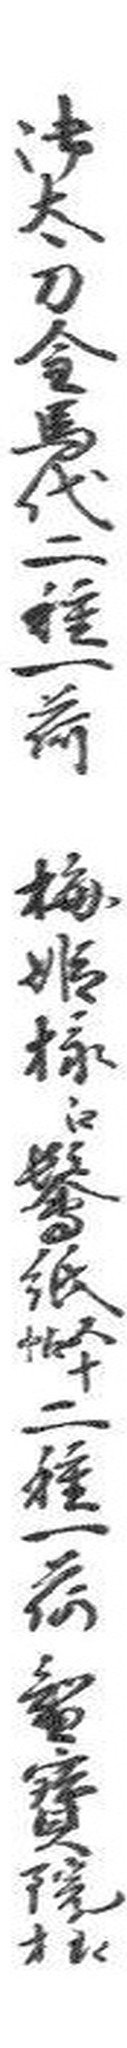御太刀金馬代二種一荷梅姫様江鬠紙五十帖二種一荷智宝院様
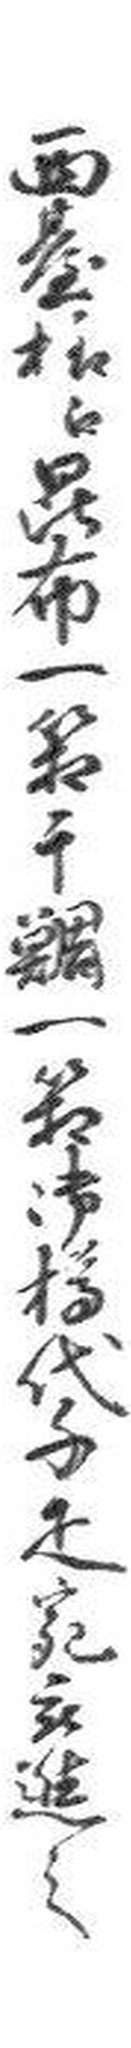西台様江昆布一箱干鯛一箱御樽代千疋宛被進之
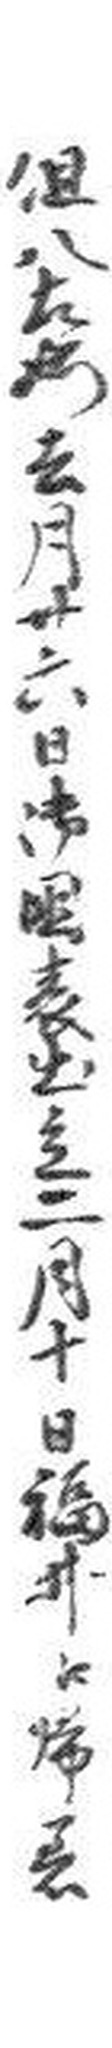但八左衛門去月廿六日御国表出立二月十日福井江帰着
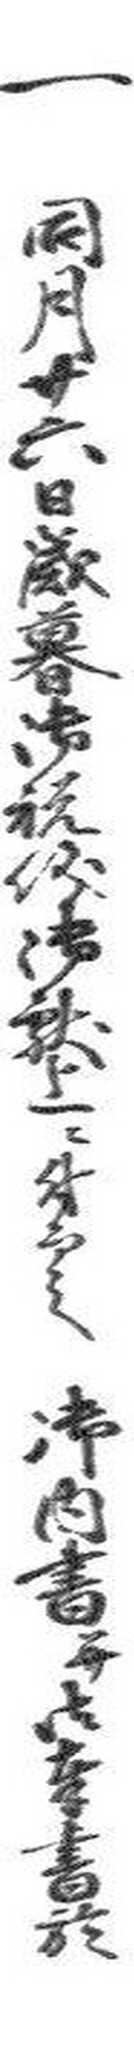一同月廿六日歳暮御祝儀御献上ニ付而之御内書并御奉書於
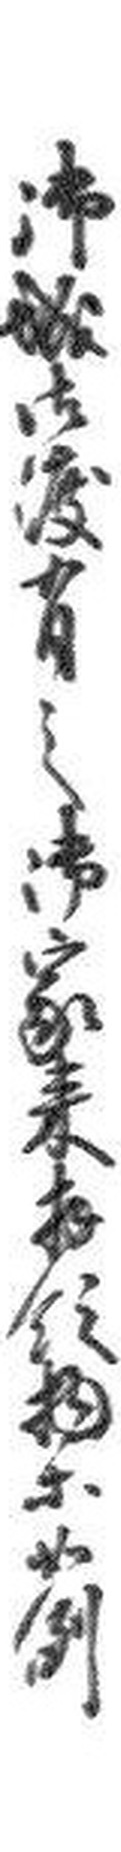御城御渡有之御家来拝領物等如例
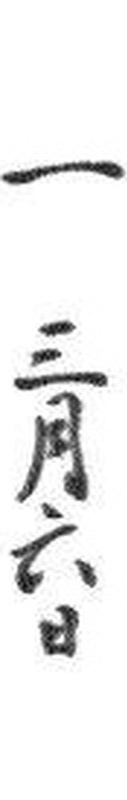一三月六日
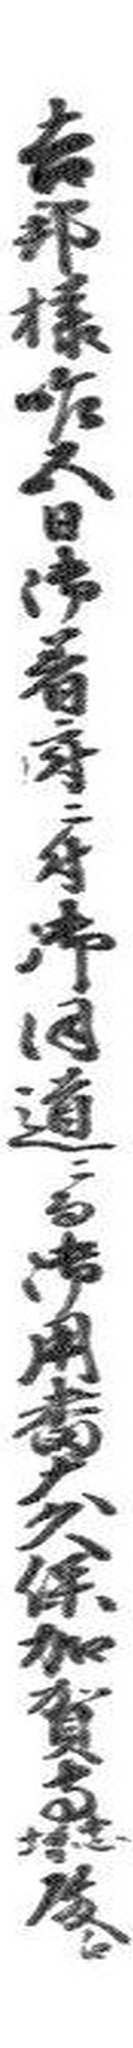吉邦様昨五日御着府ニ付御同道ニ而御用番大久保加賀守忠増殿江
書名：家譜 二十四 吉品公 従宝永三年到同五年
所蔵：福井県文書館 Fukui Prefectural Archives
